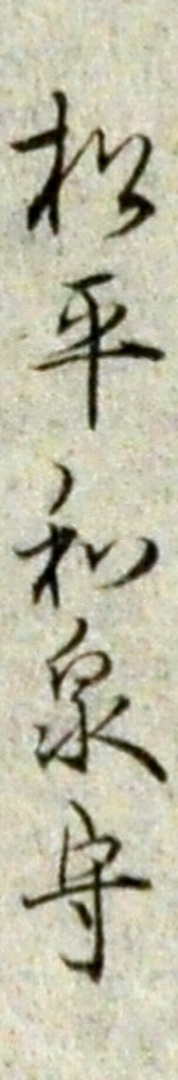松平和泉守
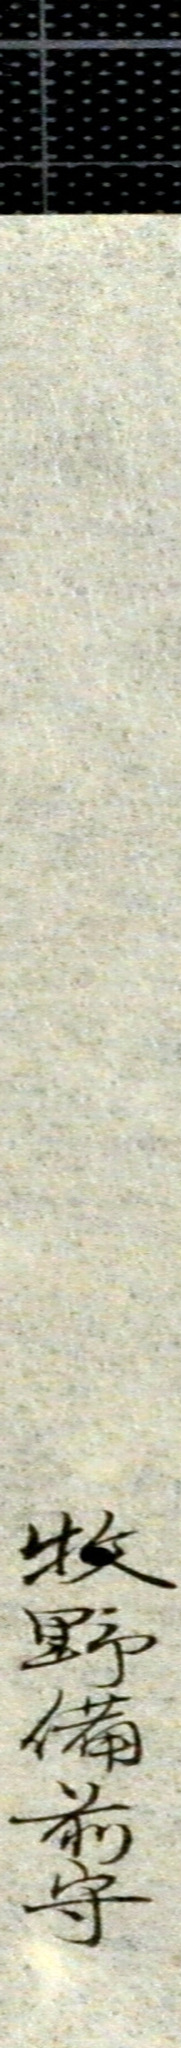牧野備前守
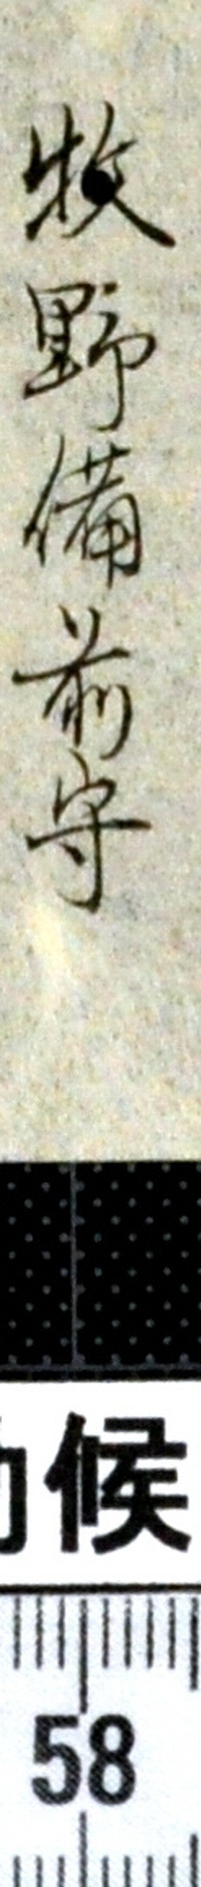牧野備前守
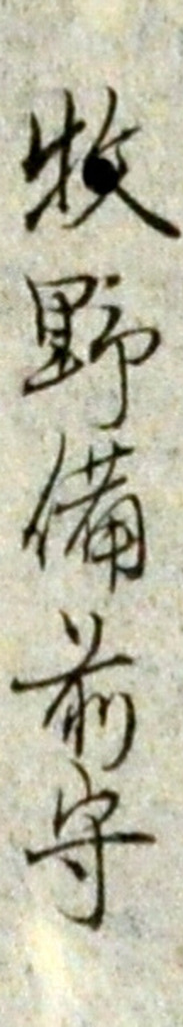牧野備前守
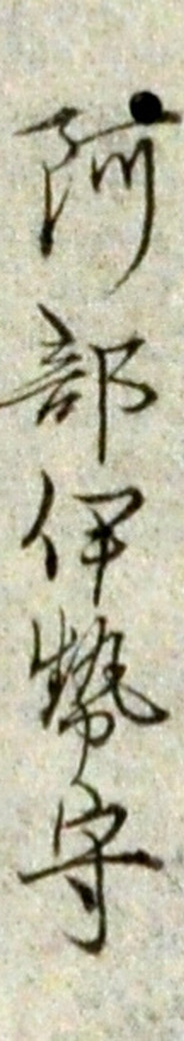阿部伊勢守
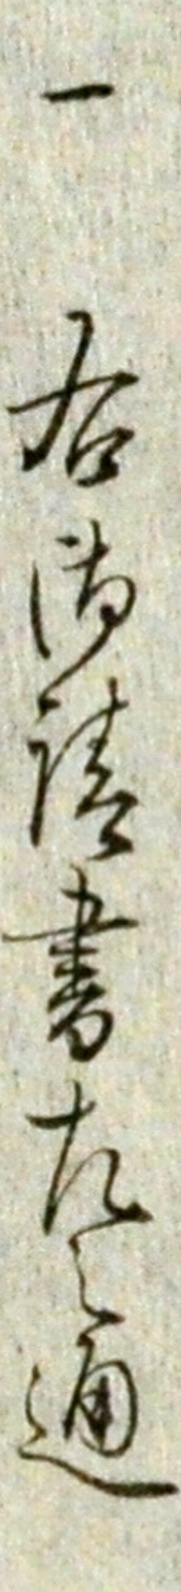一右御請書左之通
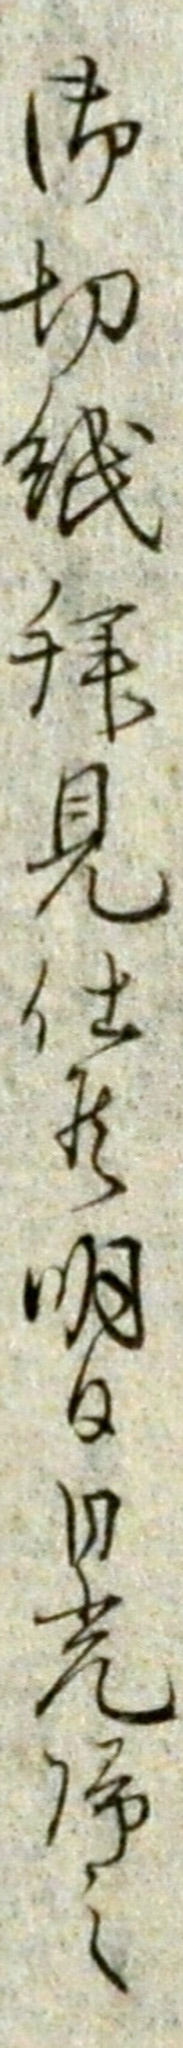御切紙拝見仕候明日日光帰之
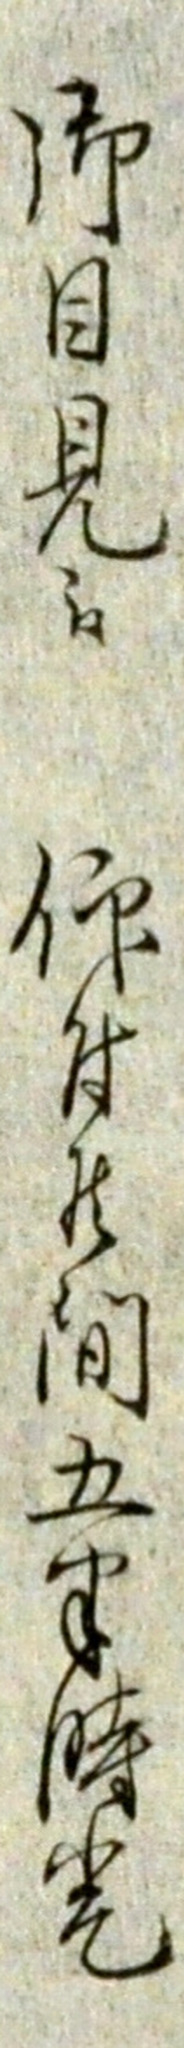御目見被仰付候間五半時登
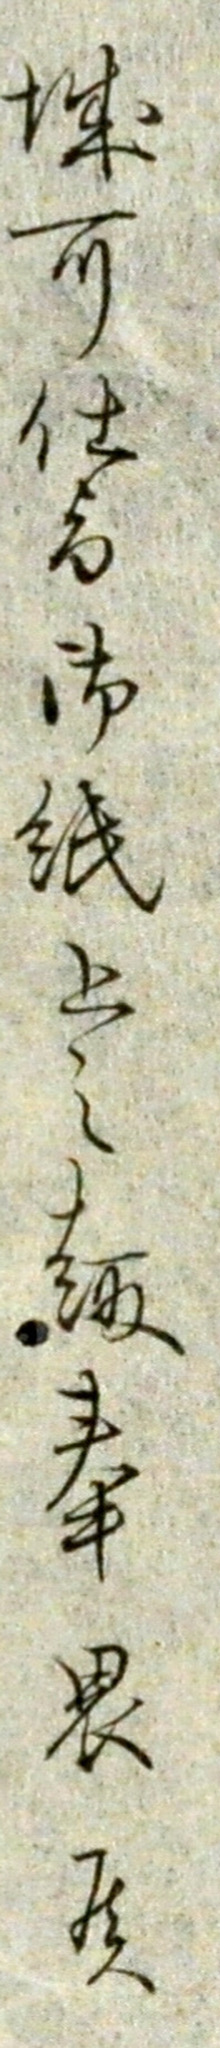城可仕旨御紙上之趣奉畏候
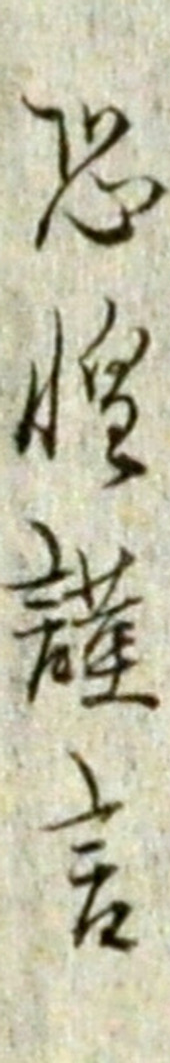恐惶謹言
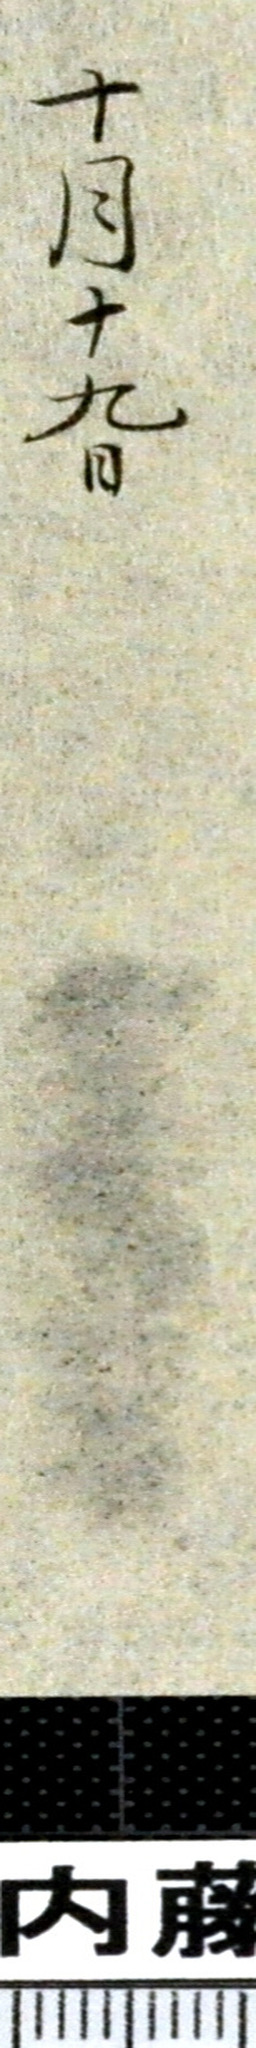十月十九日
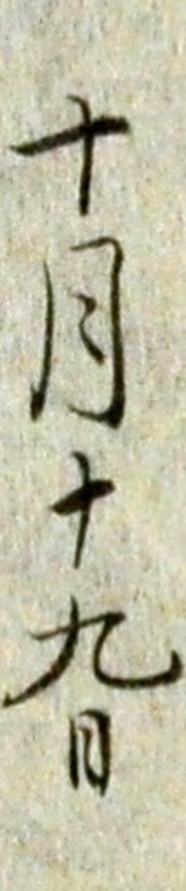十月十九日
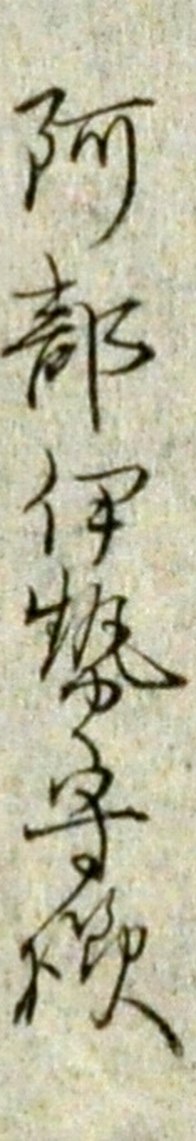阿部伊勢守様
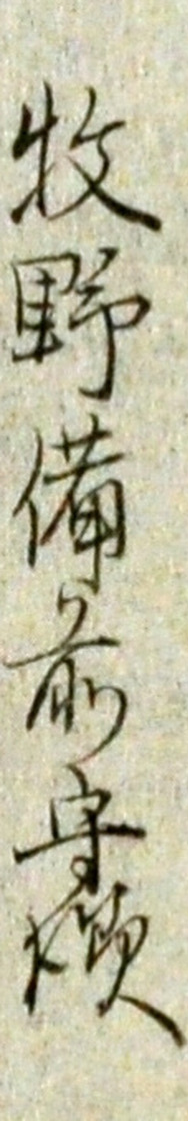牧野備前守様
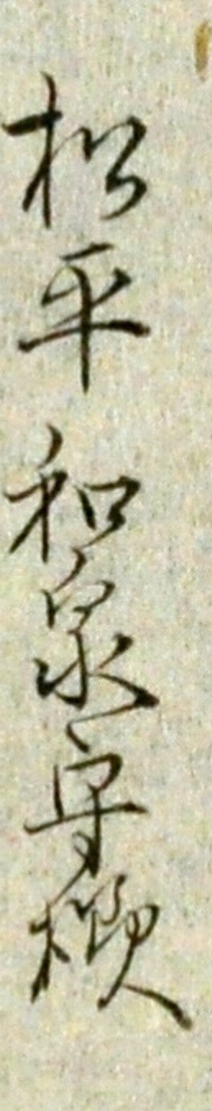松平和泉守様
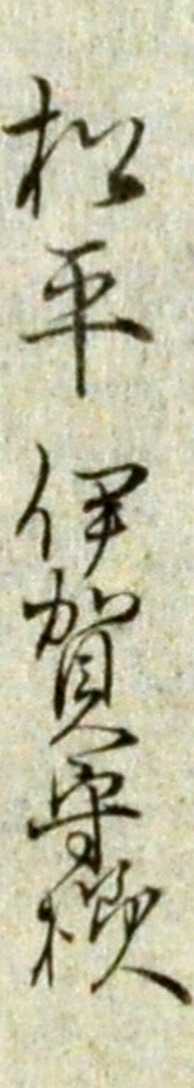松平伊賀守様
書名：日光御名代相勤候節ノ留
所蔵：伊那市立高遠町図書館・合同会社AMANE
